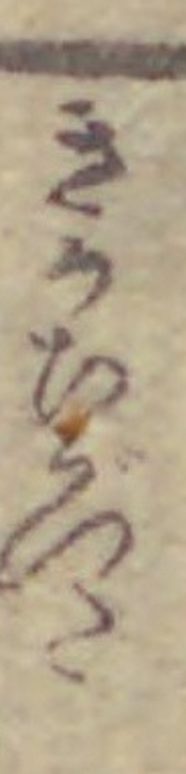きかちがつた
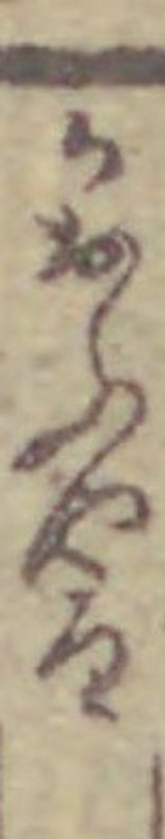かおふや様
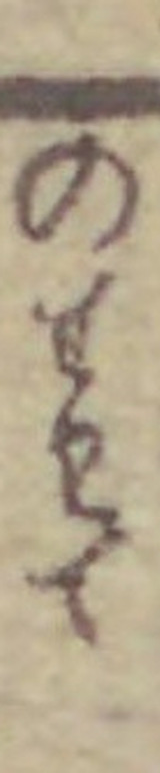のせわて
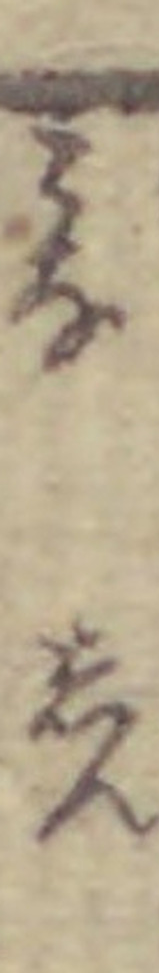こなしん
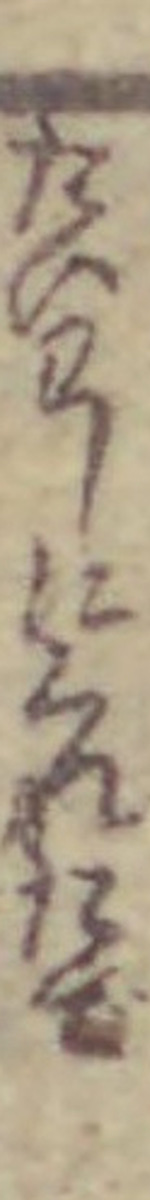たいわしにくれたで
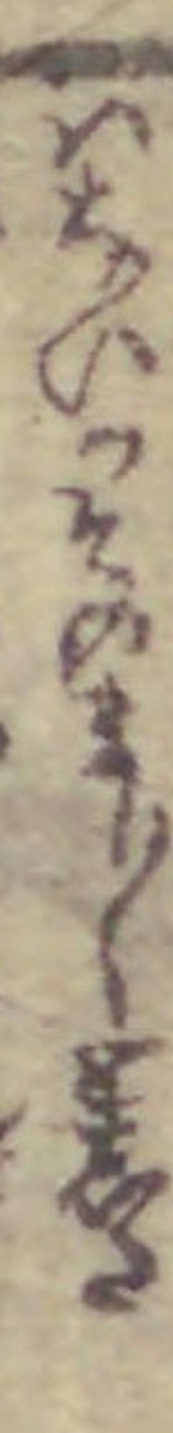はないかそのまし〳〵とした
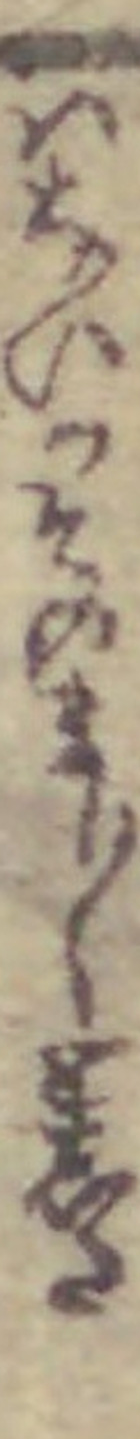はないかそのまし〳〵とした
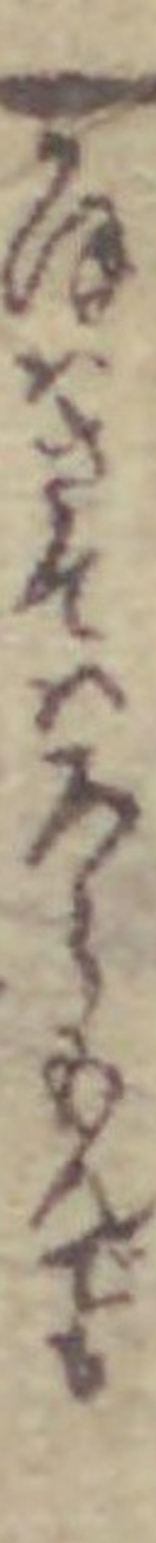かほはさてはろうもんでも
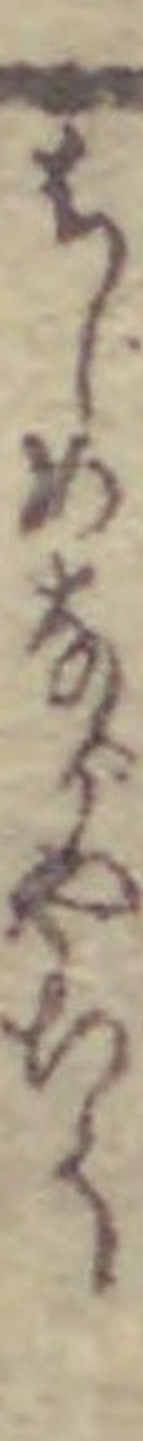はじめながやちう
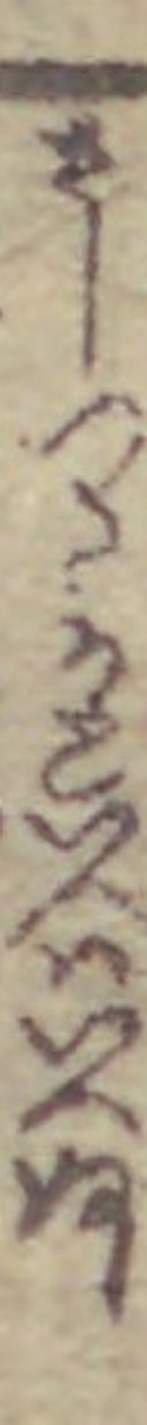さしつたかといへはいへぬし
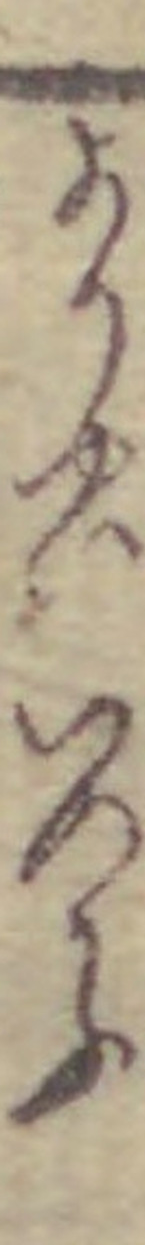よりやいいつかふ
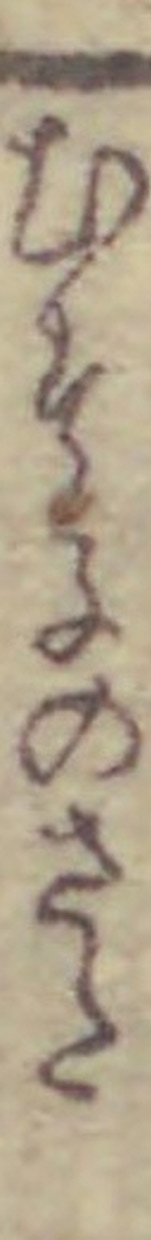むす子のさた
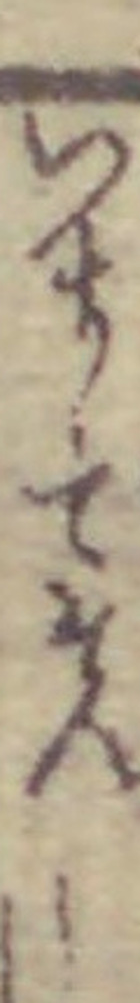いまゝてそん
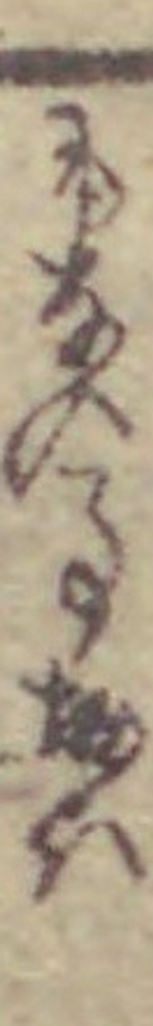もない事扨は
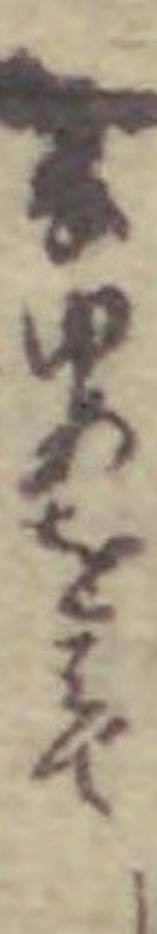なゆめをみて
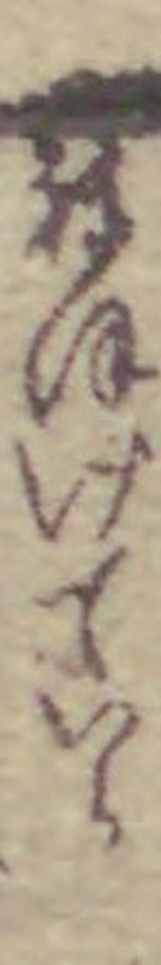ねほけていら
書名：思事夢濃枕 3巻
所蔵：国立国会図書館 National Diet Library, JAPAN
